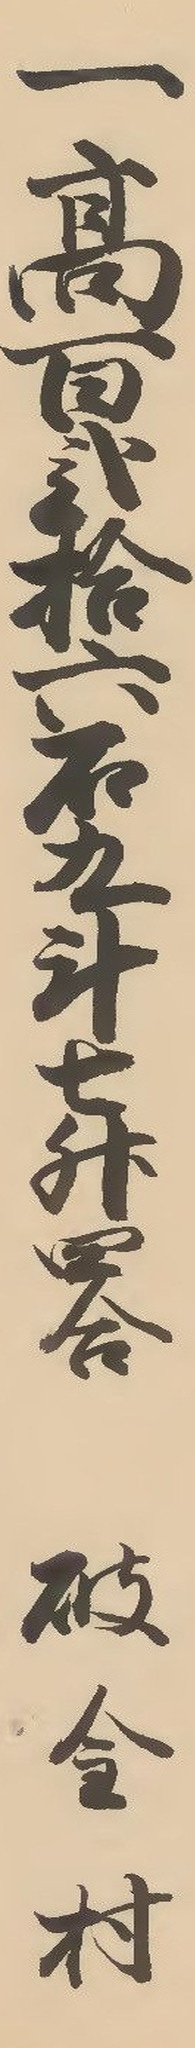一髙百弐拾六石九斗七升四合破金村
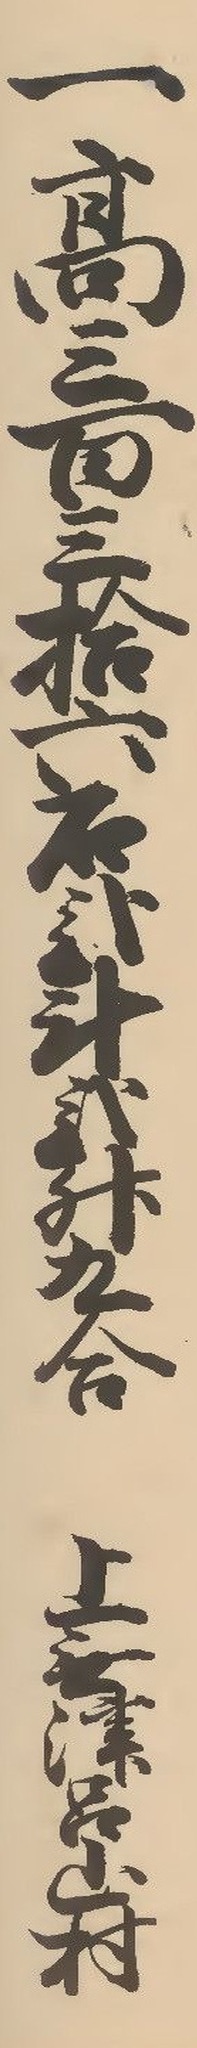一髙三百三拾六石弐斗弐升九合上無津呂山村
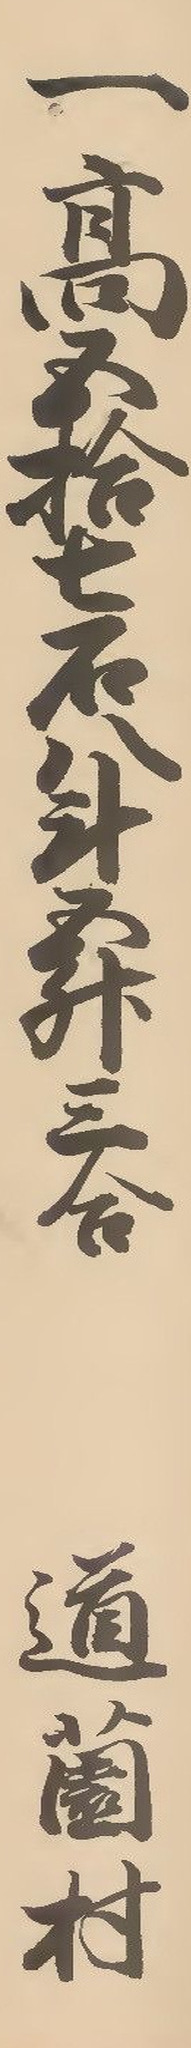一髙五拾七石八斗五升三合道薗村
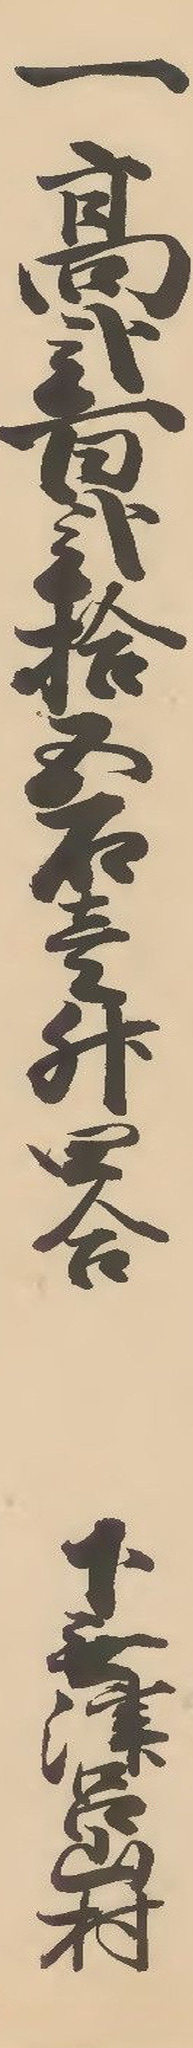一髙弐百弐拾五石壱升四合下無津呂山村
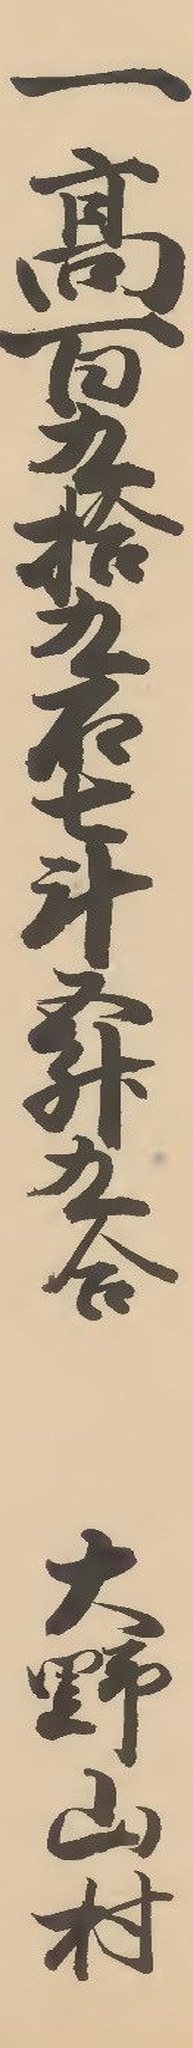一髙百九拾九石七斗五升九合大野山村
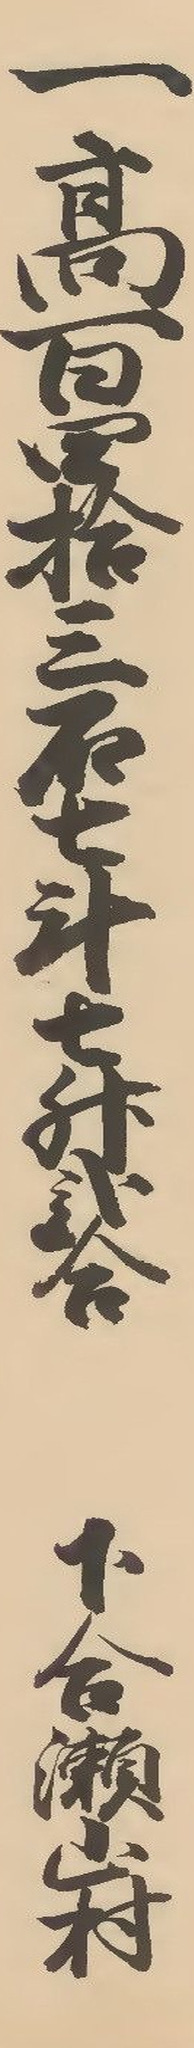一髙百四拾三石七斗七升弐合下合瀬山村

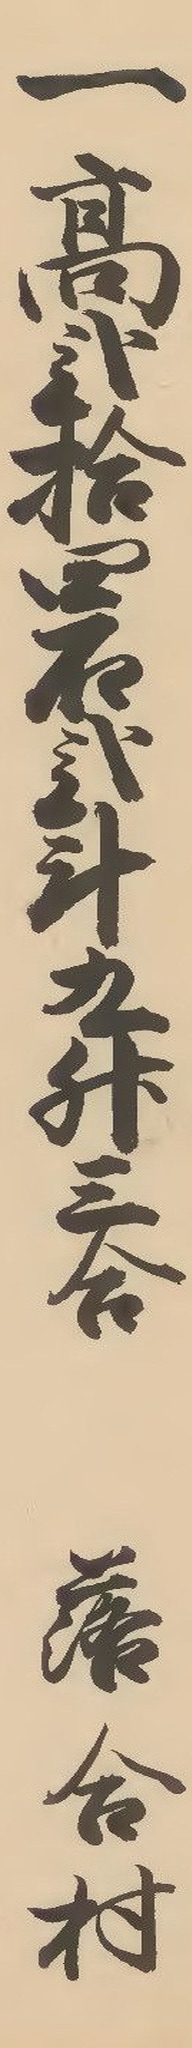一髙弐拾四石弐斗九升三合落合村
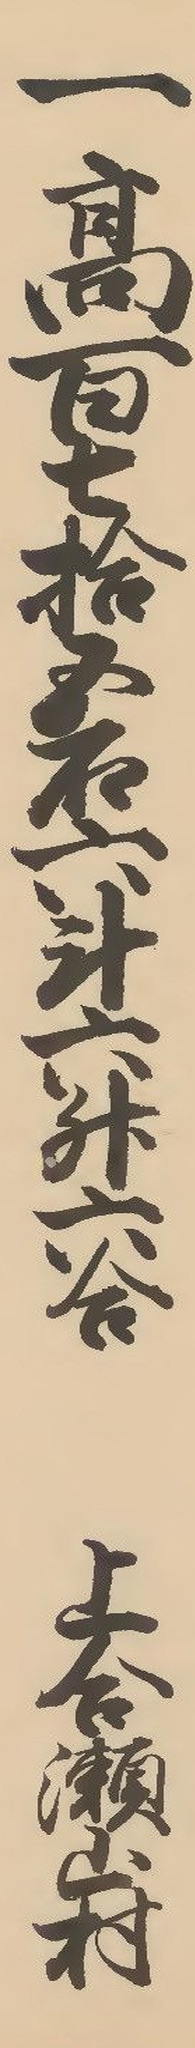一髙百七拾五石六斗六升六合上合瀬山村
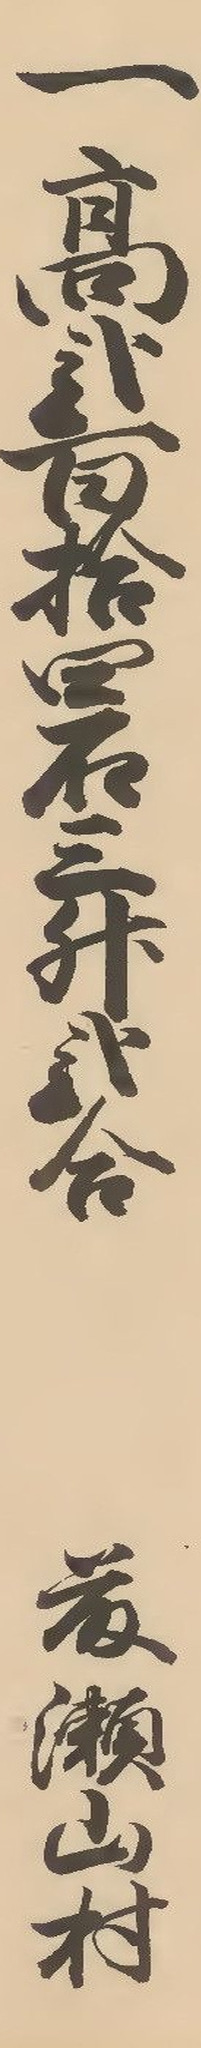一髙弐百拾四石三升弐合藤瀬山村
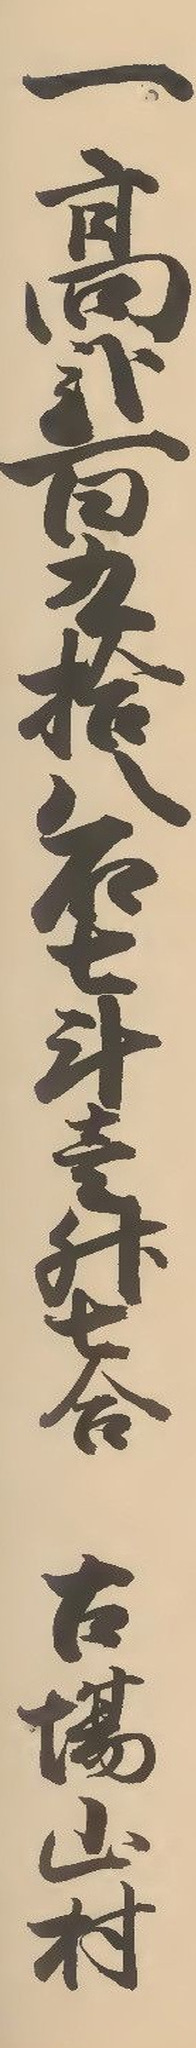一髙弐百九拾八石七斗壱升七合古場山村
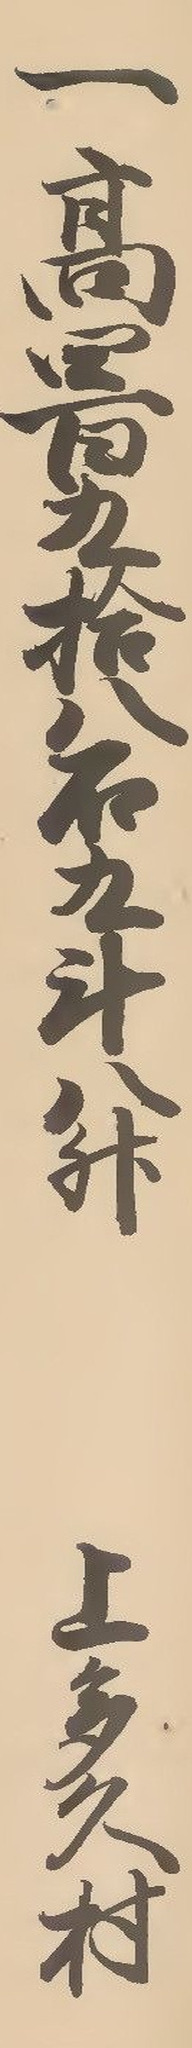一髙四百九拾八石九斗八升上多久村
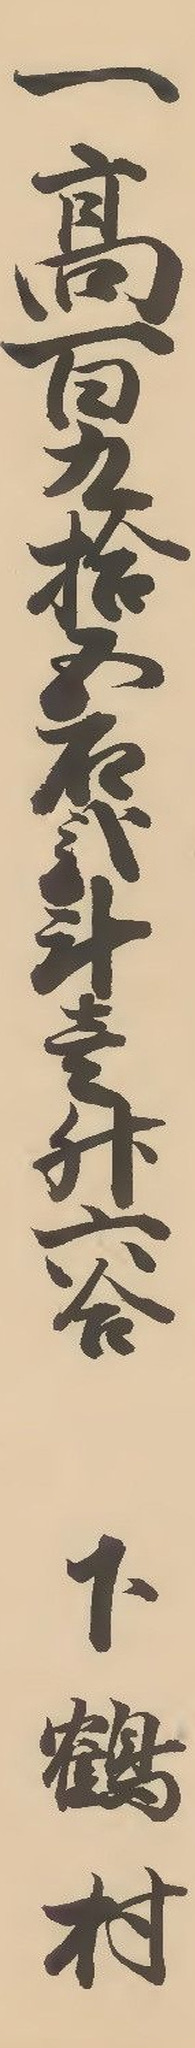一髙百九拾五石弐斗壱升六合下鶴村
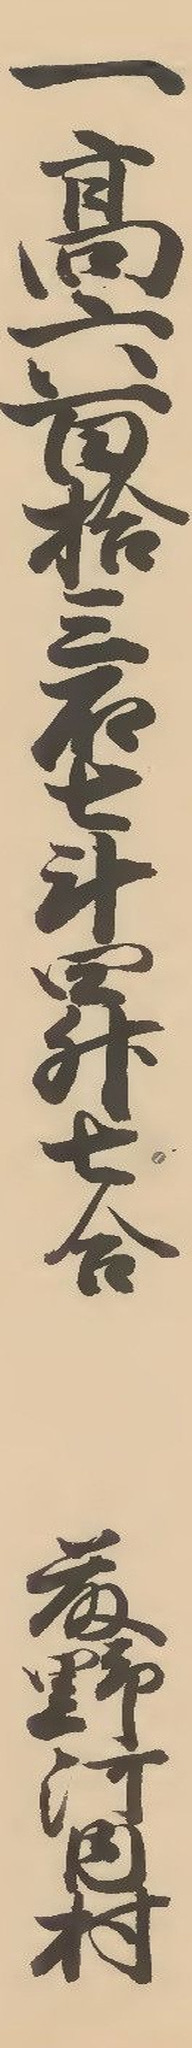一髙六百拾三石七斗四升七合藤野河内村
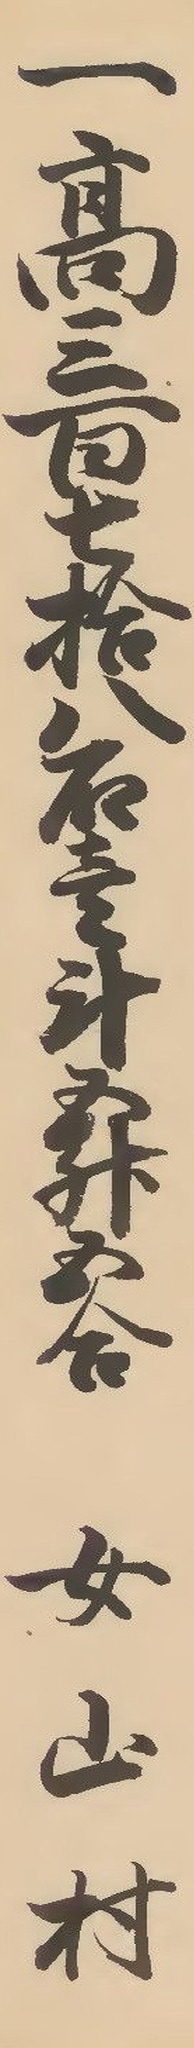一髙三百七拾八石壱斗五升五合女山村

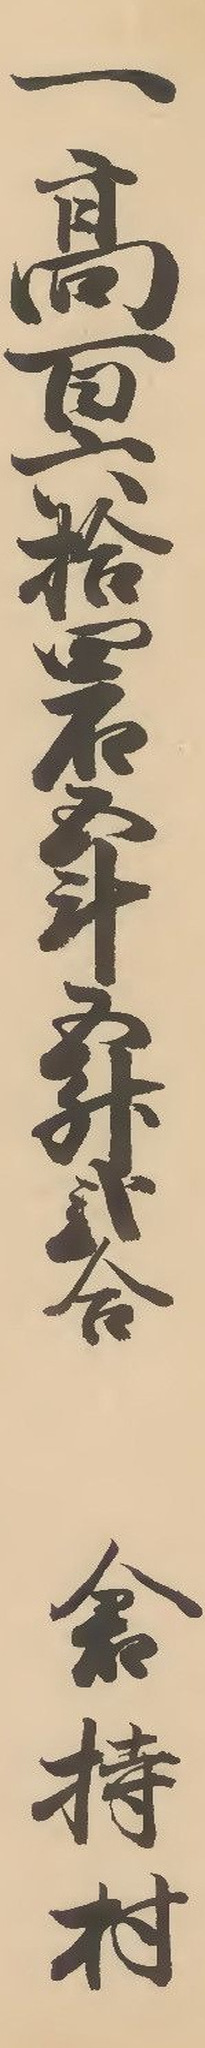一髙百六拾四石五斗五升弐合倉持村
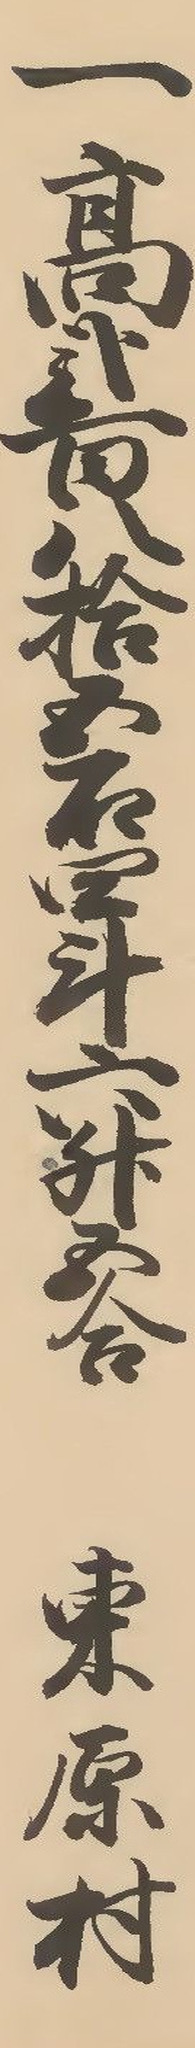一髙弐百八拾五石四斗六升五合東原村
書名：肥前国郷帳
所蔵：国立公文書館 National Archives of Japan
